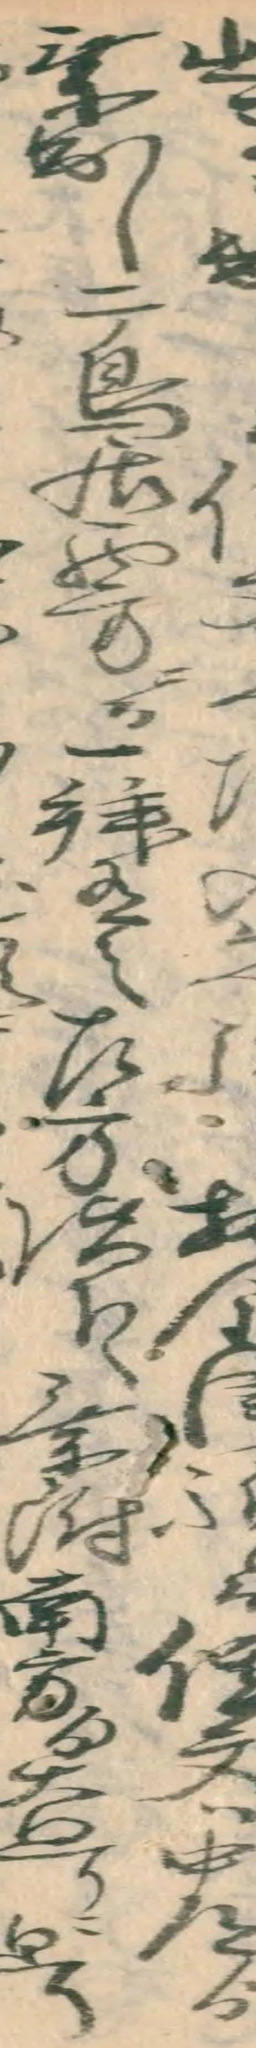乗出し二ノ鳥居西方ニ而一拝有之左方階下へ乗付南方ゟ大廻りニ廻り
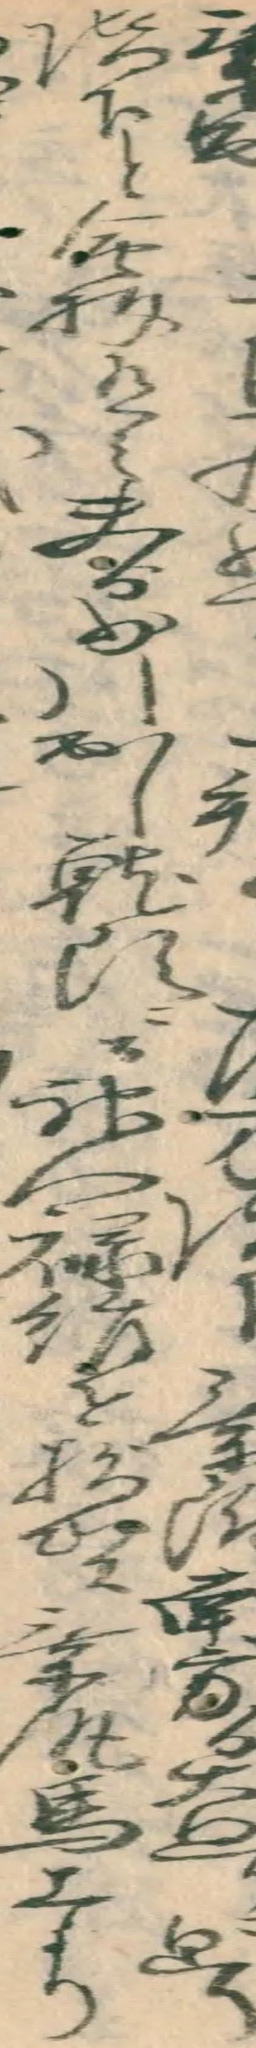階下と会拶有之夫ゟ少引出し乾頭ニ而神人禄絹を指出ス乗尻馬上より
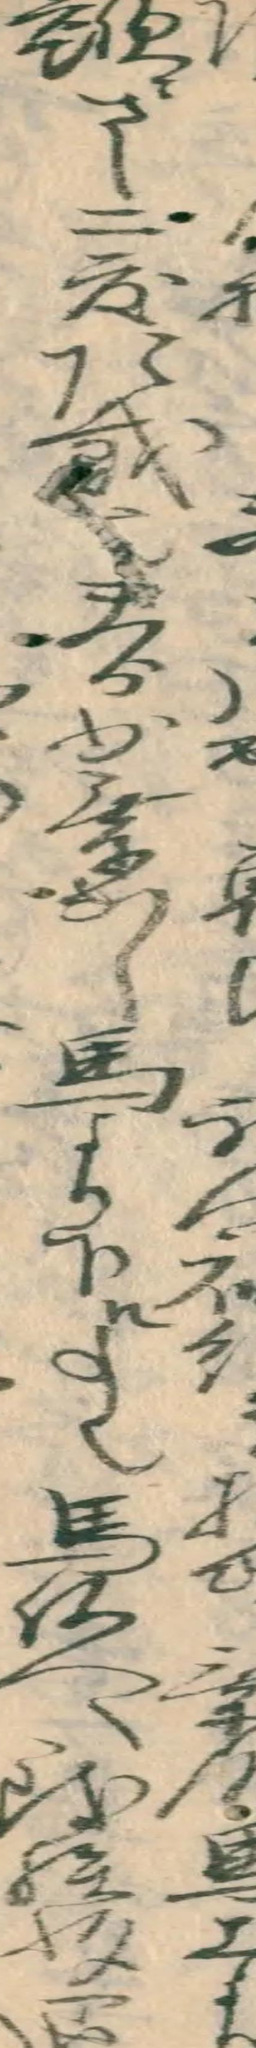鞭ニさし二度頂戴也夫ゟ少乗出し馬より下ル事也馬役人へ致挨拶退
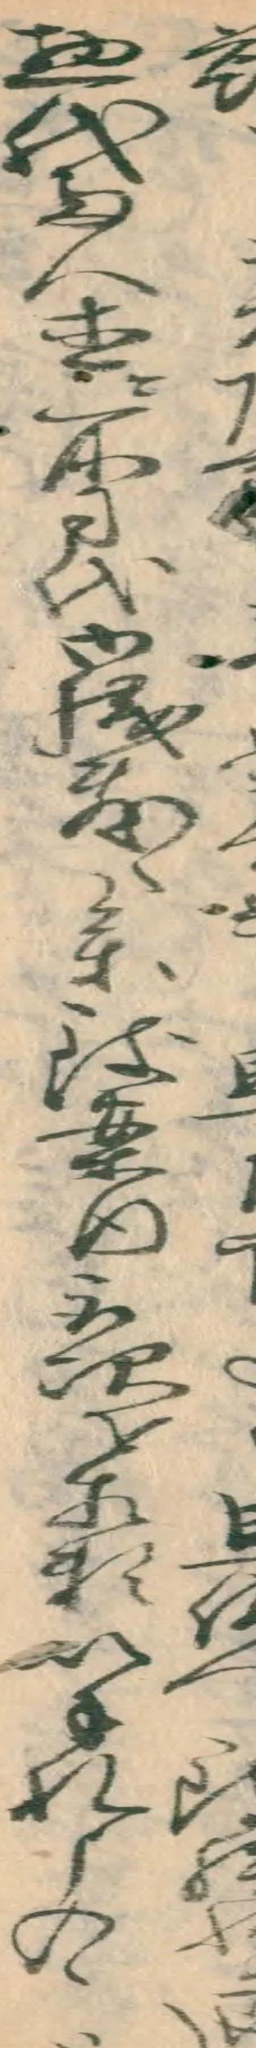惣代両人直ニ所司代御桟敷へ参致案内取次を相頼以手札申入候ハ
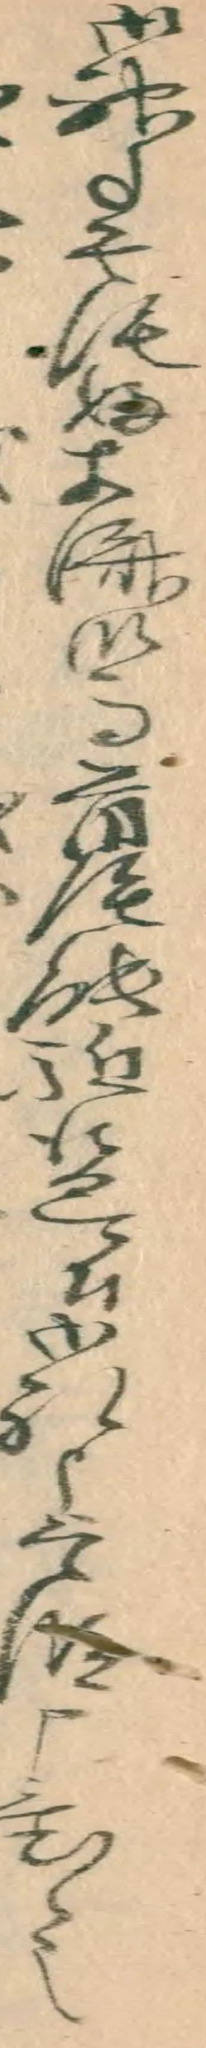御神事其首尾好相済御馬首尾能駈仕廻ニ付御礼申上候段申置候也
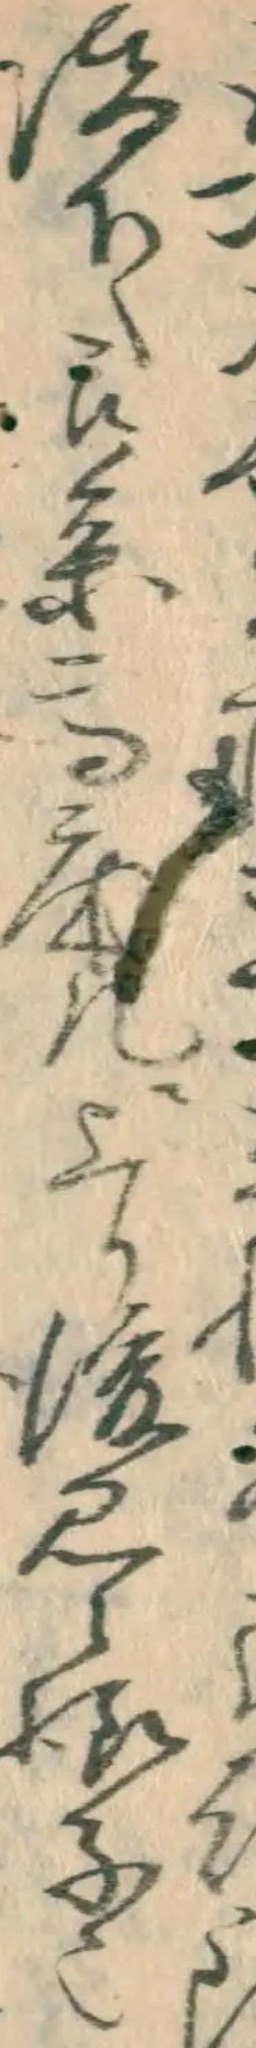階下へ被参高床几ニ上り後見候様子也
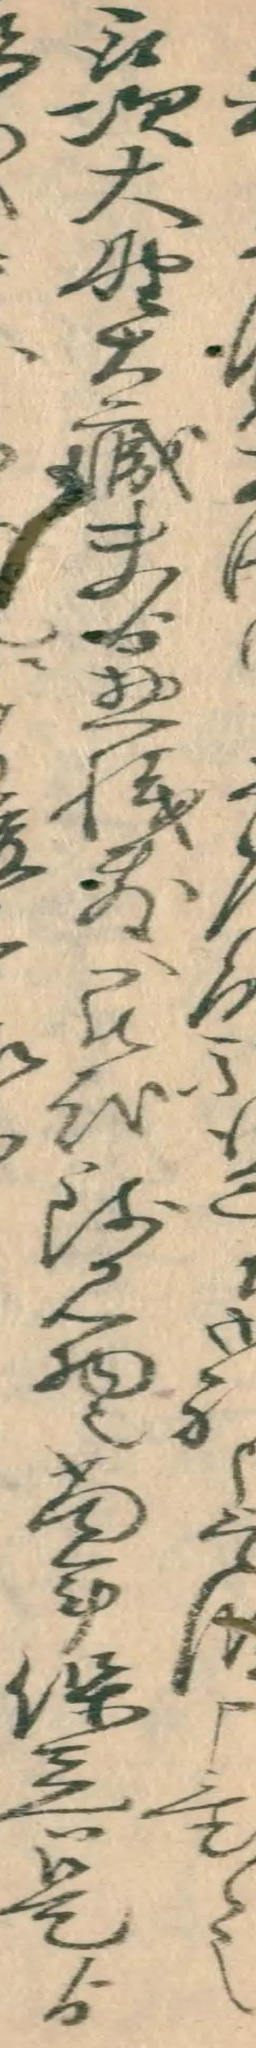取次大野大蔵夫ゟ惣桟敷へ罷越致見物也当年保覚ハ是ゟ
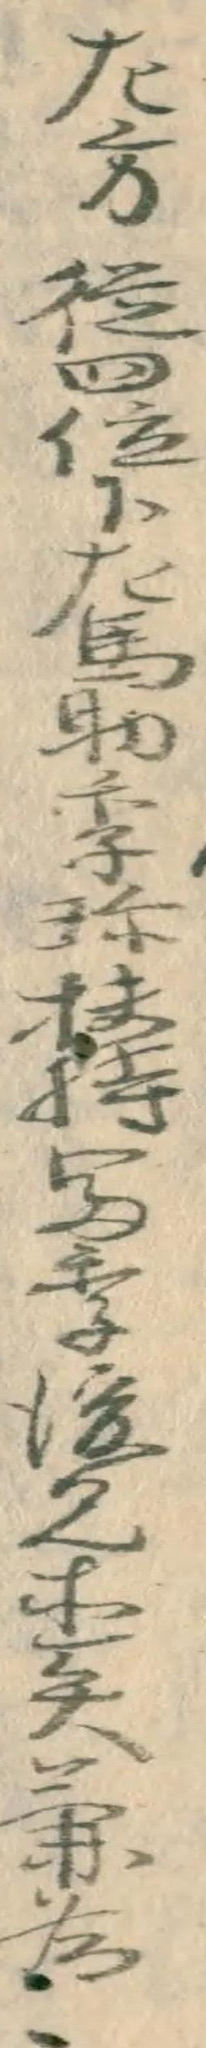階下左方従四位下左馬助季珎扶持富季後見直矢兼為
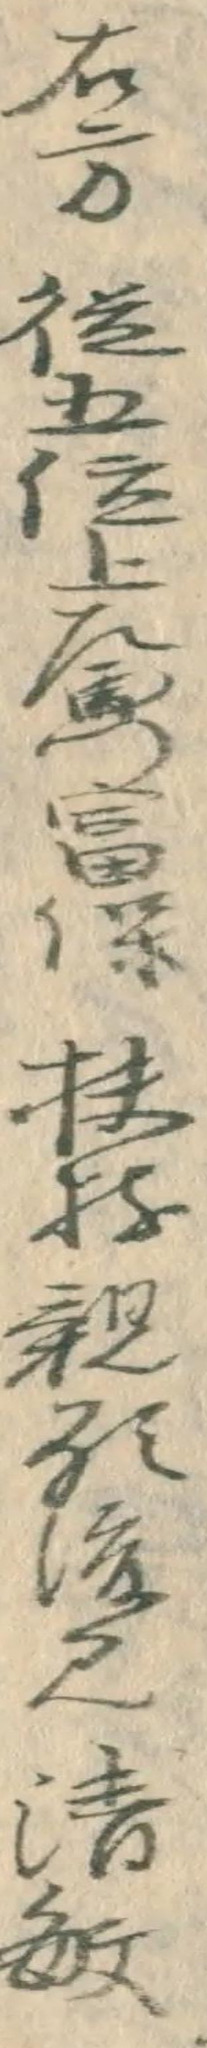右方従五位上左衛門富保扶持親顕後見清敏
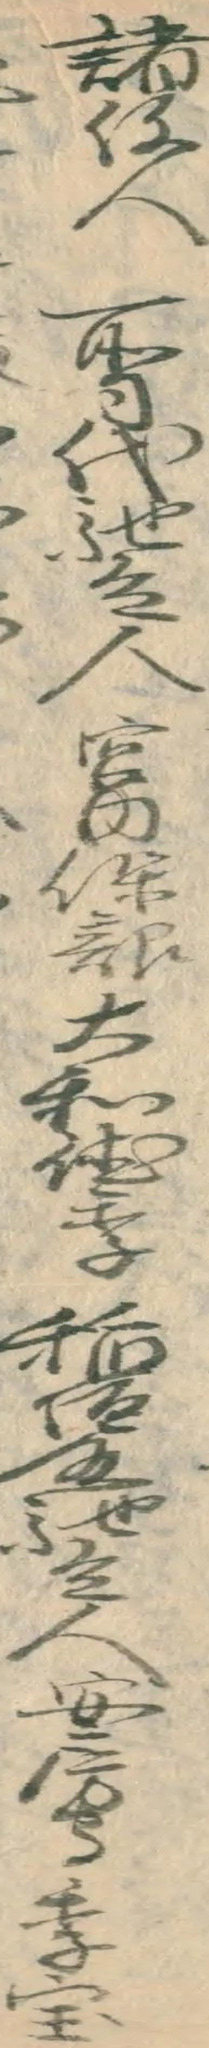諸役人所司代馳走人宮内保韶大和徳李稲垣殿馳走人安房守季宝
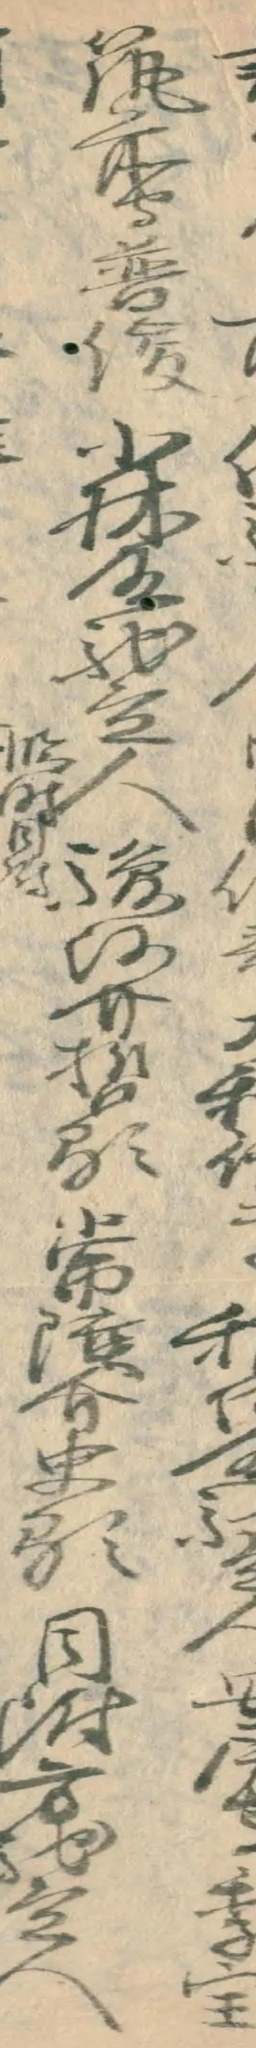筑前守普俊小林殿馳走人駿河介哲顕常陸介史顕目付方馳走人

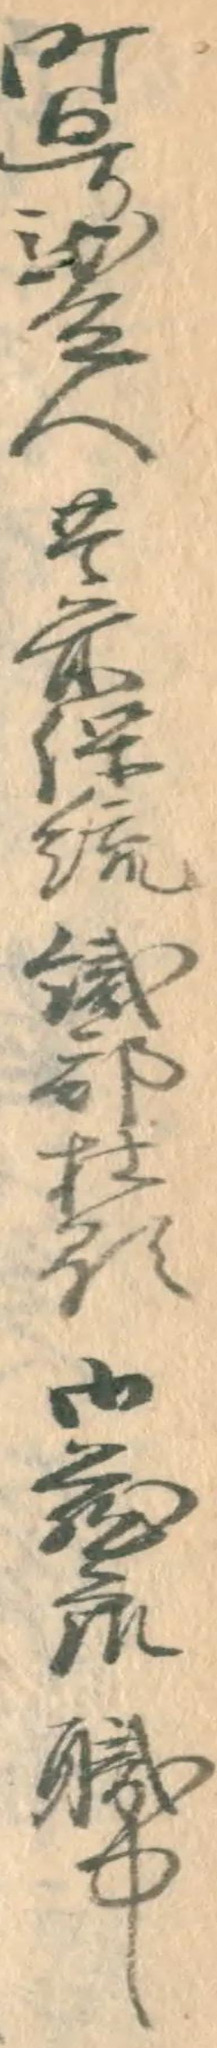町廻り馳走人豊前保統織部杜顕御蔵衆職中
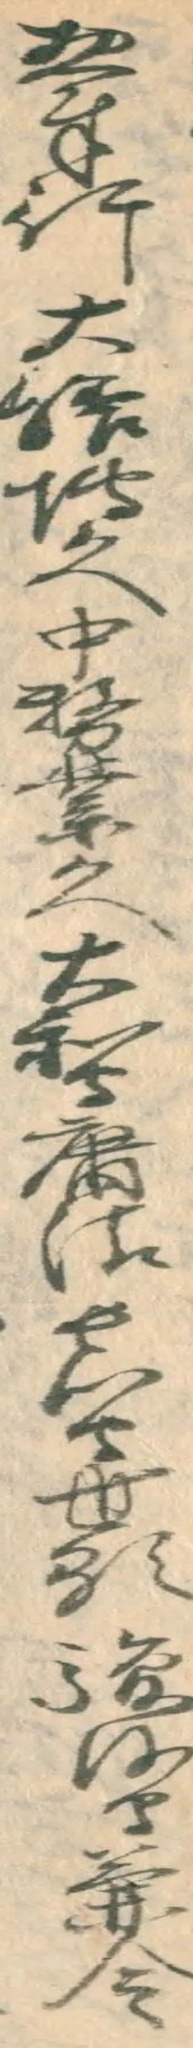惣奉行大膳博久中務業久大和守庸清長門守世顕駿河守兼令
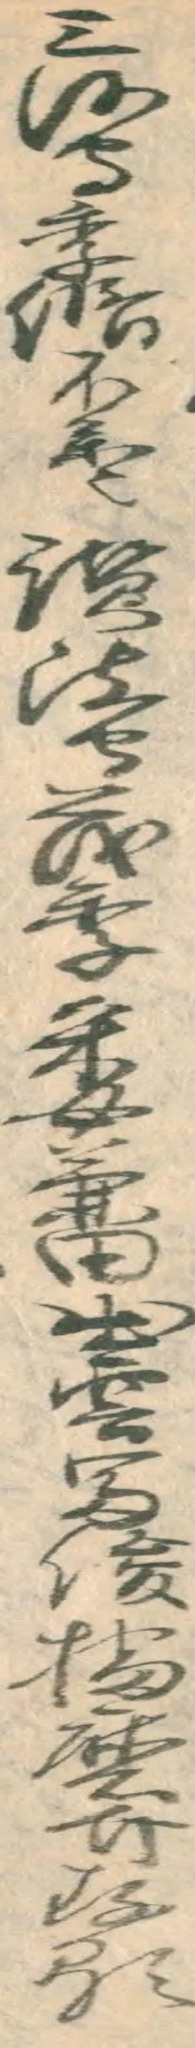三河守季脩不参也讃岐守茂季采女兼田出雲富俊播磨介存顕
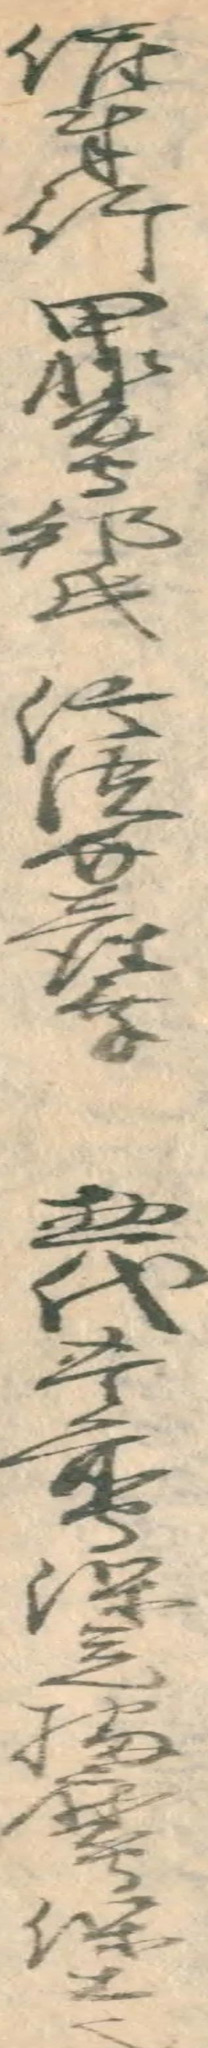催奉行甲斐守邦氏信濃介産幸惣代豊前守保覚播磨守保土也
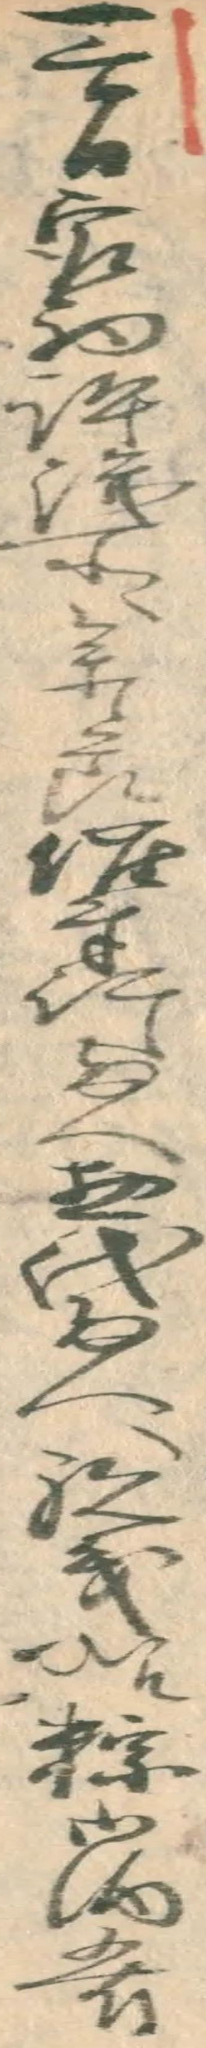一今日最初評議所へ参候節催奉行両人惣代両人へ祝義出ル粽御酒肴
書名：賀茂社記録. 第58冊
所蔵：国立国会図書館 National Diet Library, JAPAN
